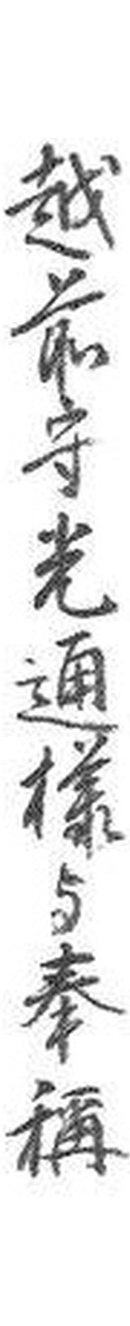越前守光通様与奉称
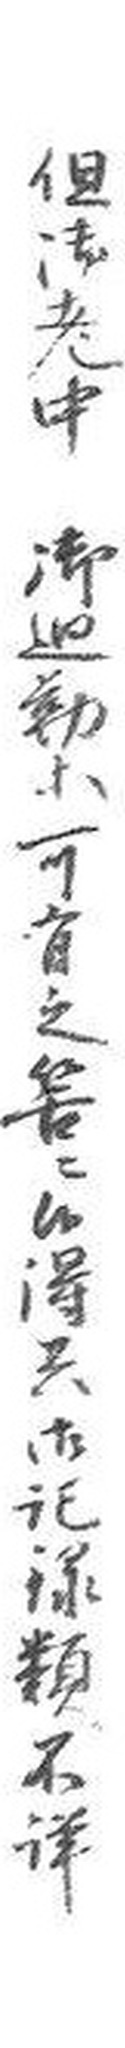但御老中御廻勤等可有之筈ニ候得共御記録類不詳
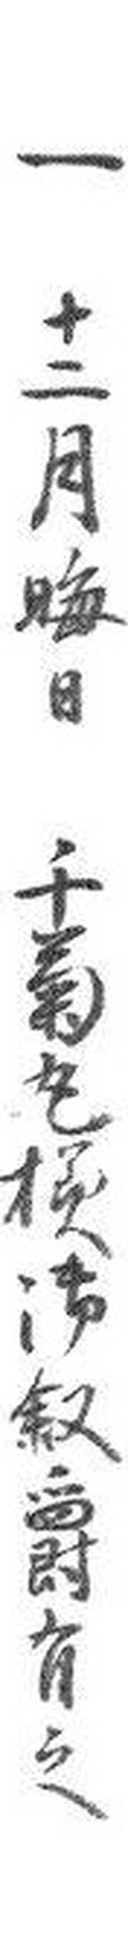一十二月晦日千菊丸様御叙爵有之
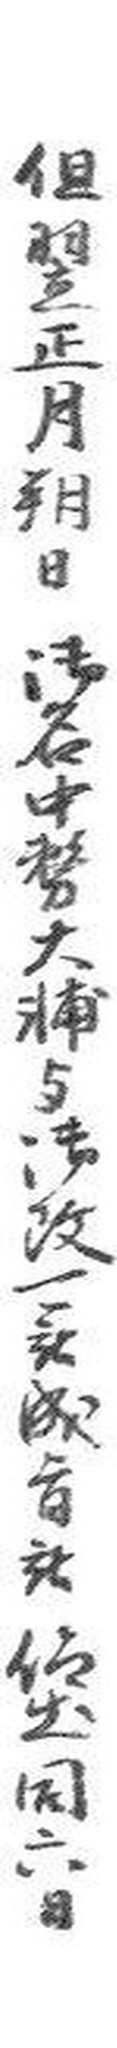但翌正月朔日御名中務大輔与御改可被成旨被仰出同六日
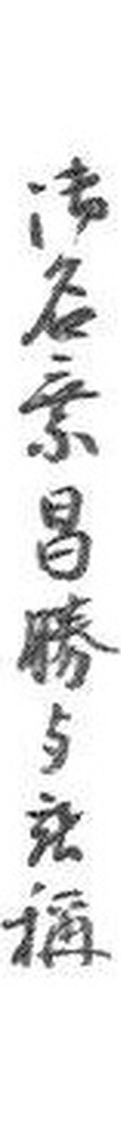御名乗昌勝与被称
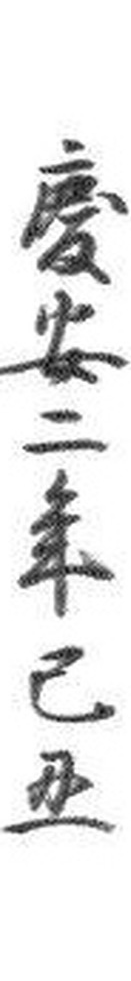慶安二年己丑
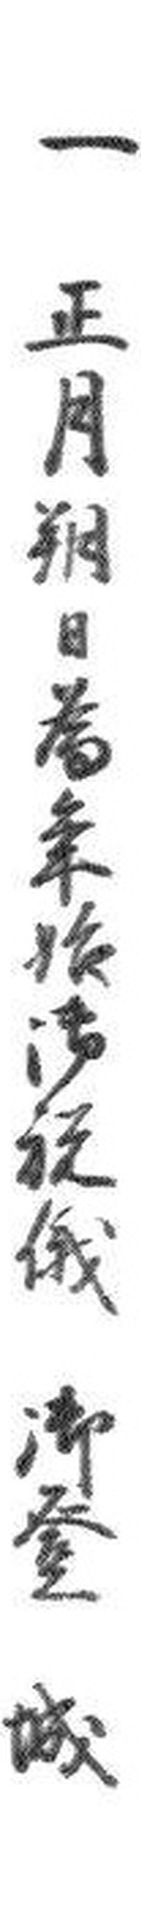一正月朔日為年始御祝儀御登城
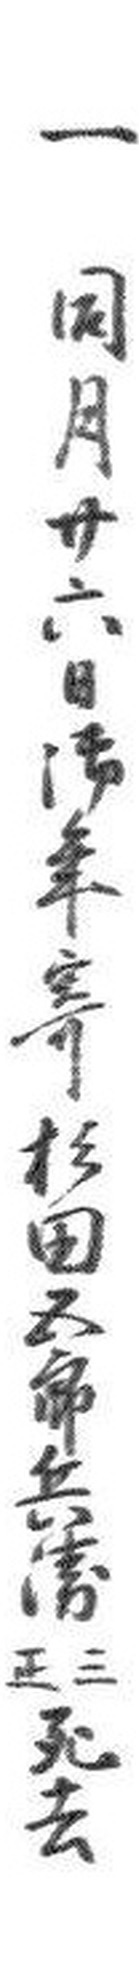一同月廿六日御年寄杉田五郎兵衛三正死去
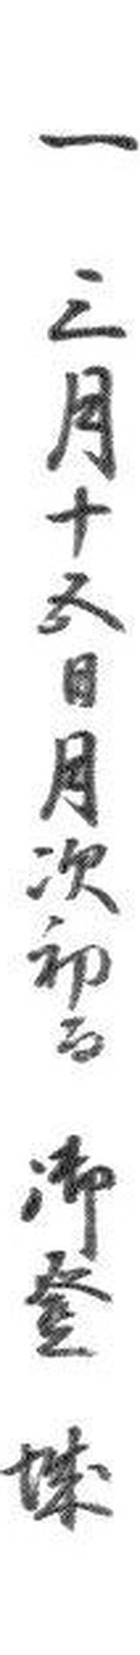一三月十五日月次初而御登城
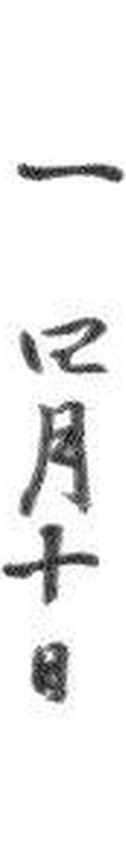一四月十日
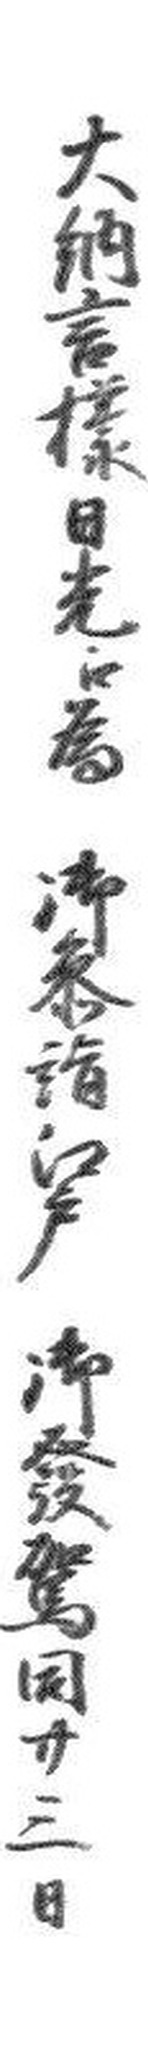大納言様日光江為御参詣江戸御発駕同廿三日
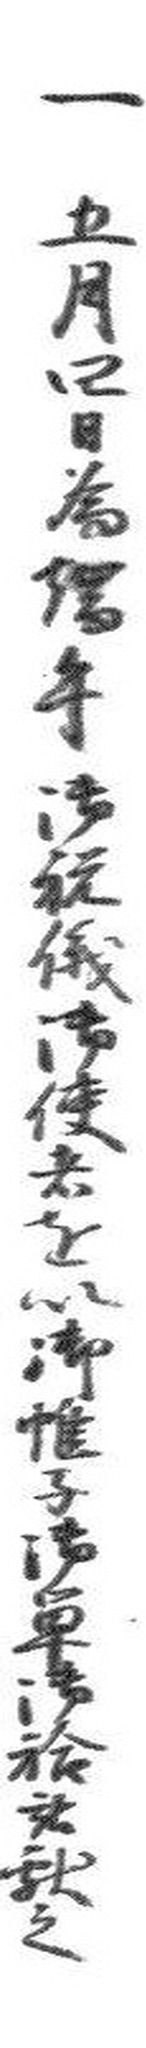一五月四日為端午御祝儀御使者を以御帷子御単御袷被献之

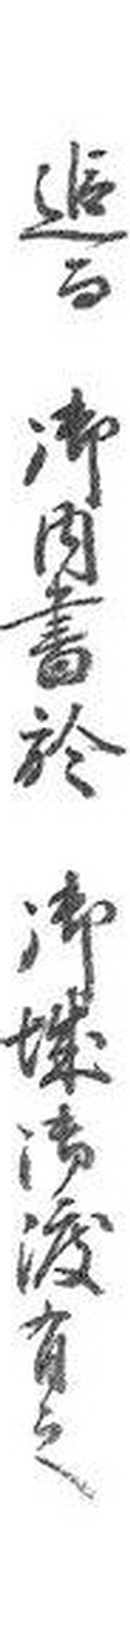追而御内書於御城御渡有之
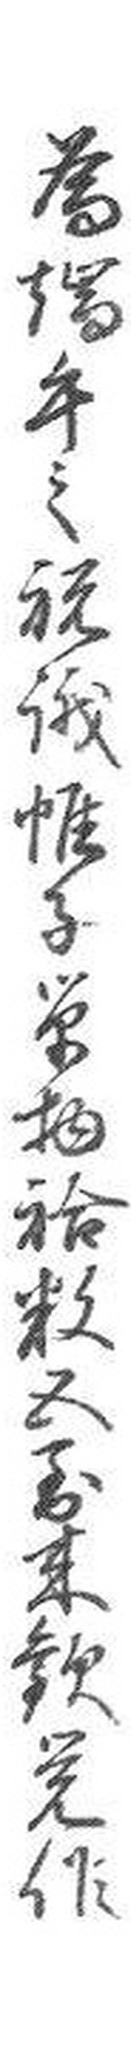為端午之祝儀帷子単物袷数五到来歓覚作
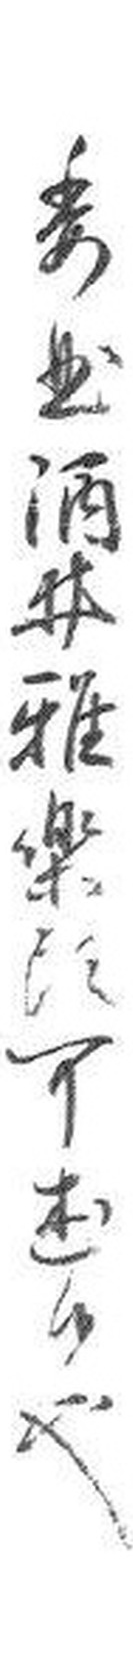委曲酒井雅樂頭聞述候也
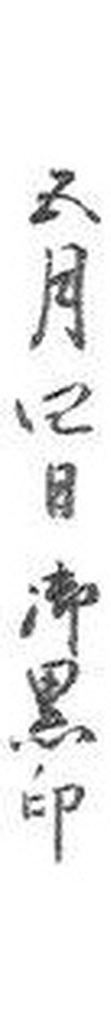五月四日御黒印
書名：家譜 五 光通公 従寛永十三年到万治二年
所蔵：福井県文書館 Fukui Prefectural Archives
